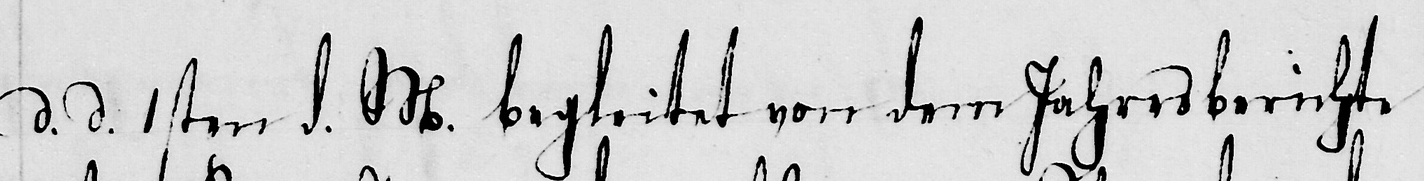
d. d. 1sten d. M. begleitet von dem Jahresberichte
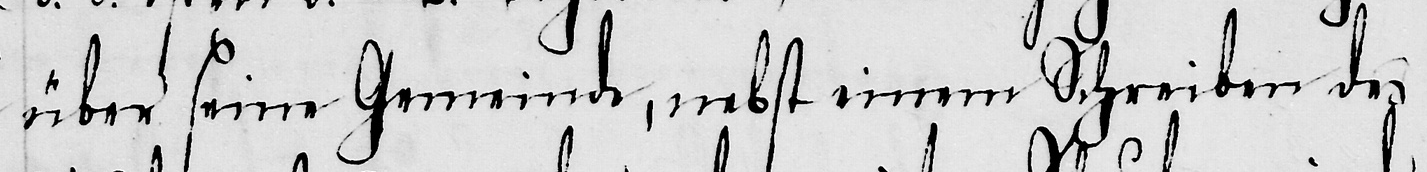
über seine Gemeinde, nebst einem Schreiben des
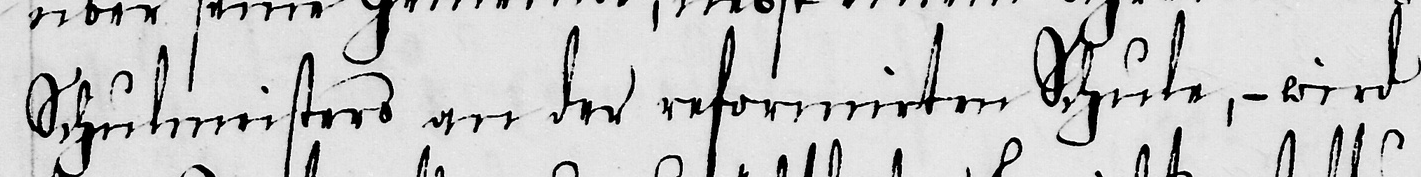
Schulmeisters an der reformirten Schule, – wird
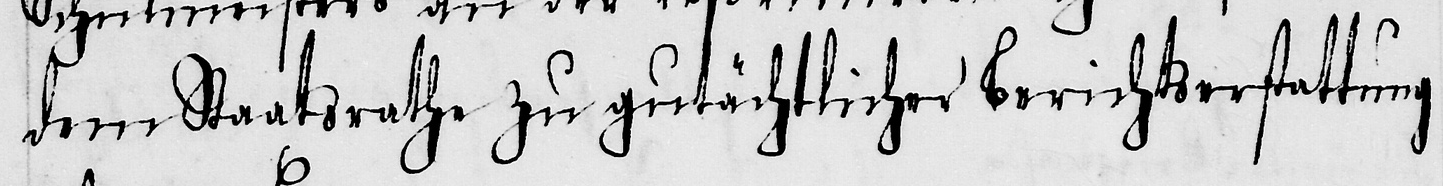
dem Staatsrathe zu gutächtlicher Berichterstattung
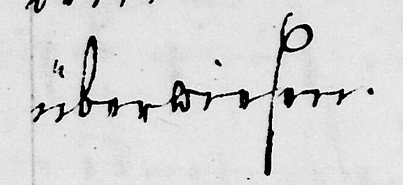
überwiesen.
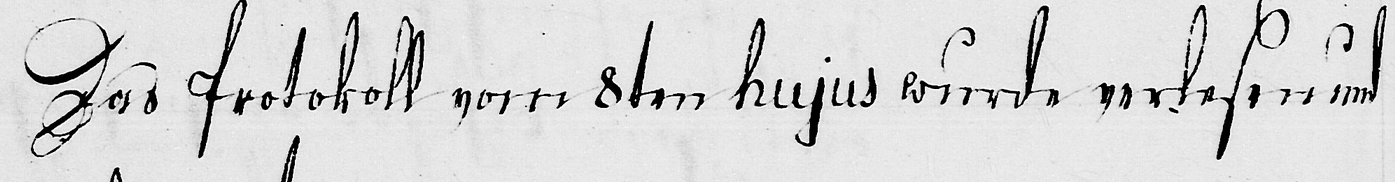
Das Protokoll vom 8ten hujus wurde verlesen und
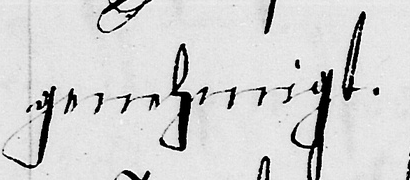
genehmigt.
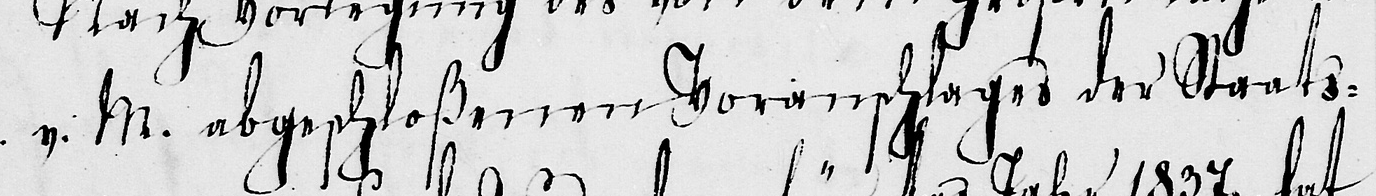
v. M. abgeschloßenen Voranschlages der Staats¬
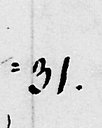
31.
